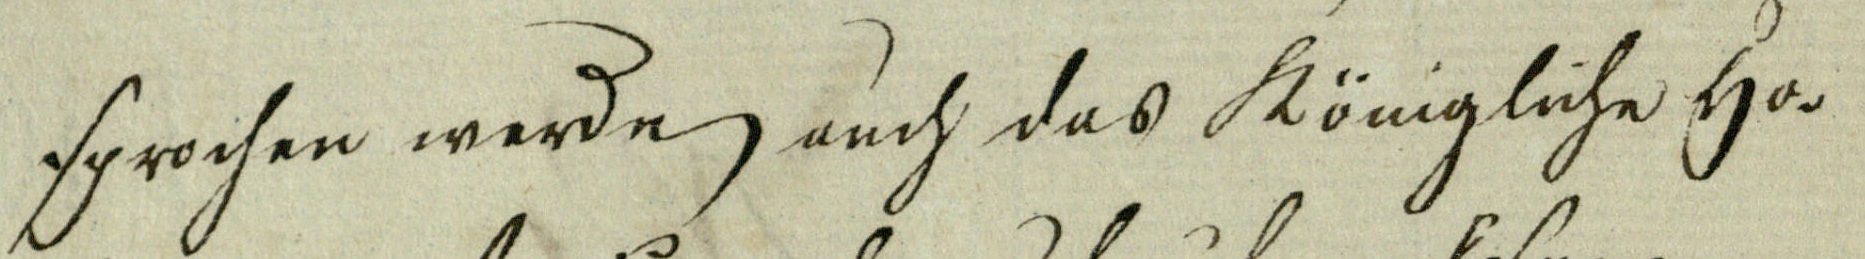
sprochen werde auch das Königliche Ho¬
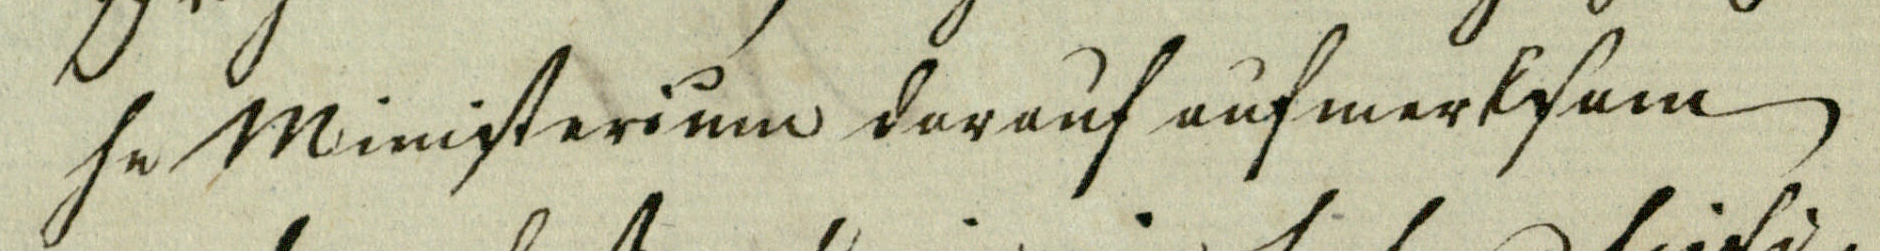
he Ministerium darauf aufmerksam
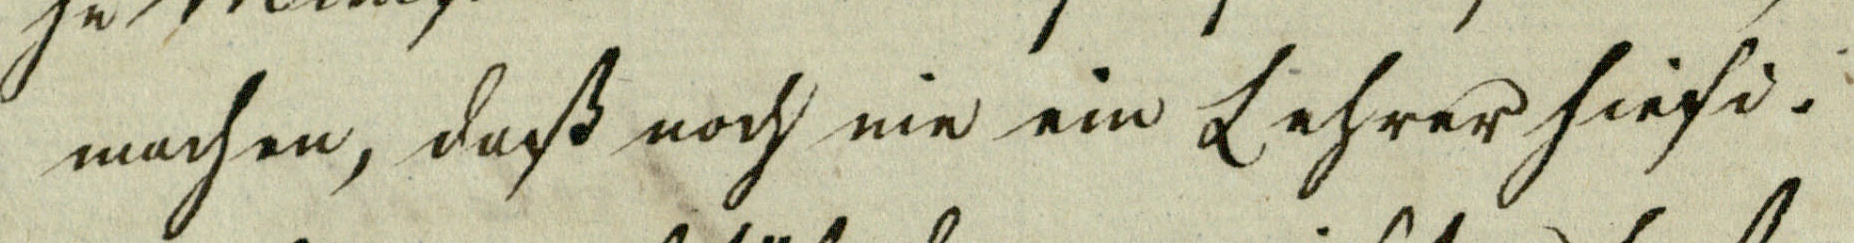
machen, daß noch nie ein Lehrer hiesi¬
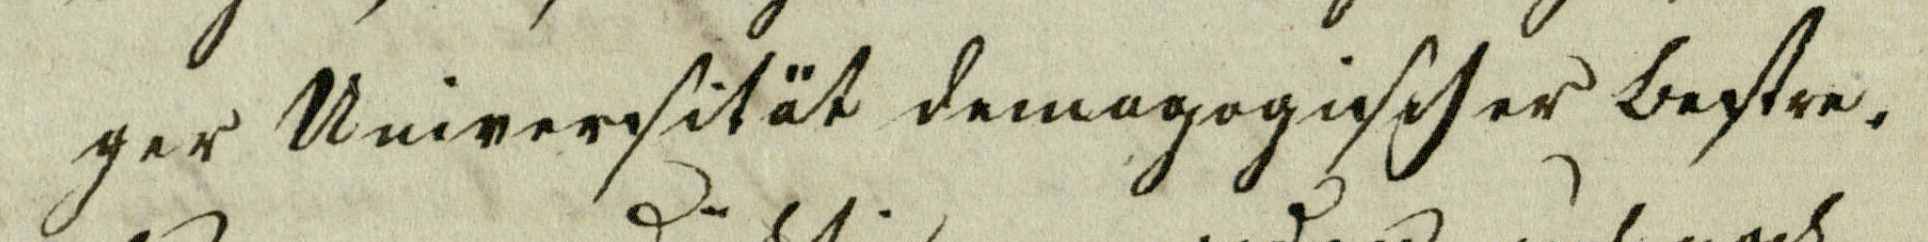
ger Universität demagogischer Bestre¬
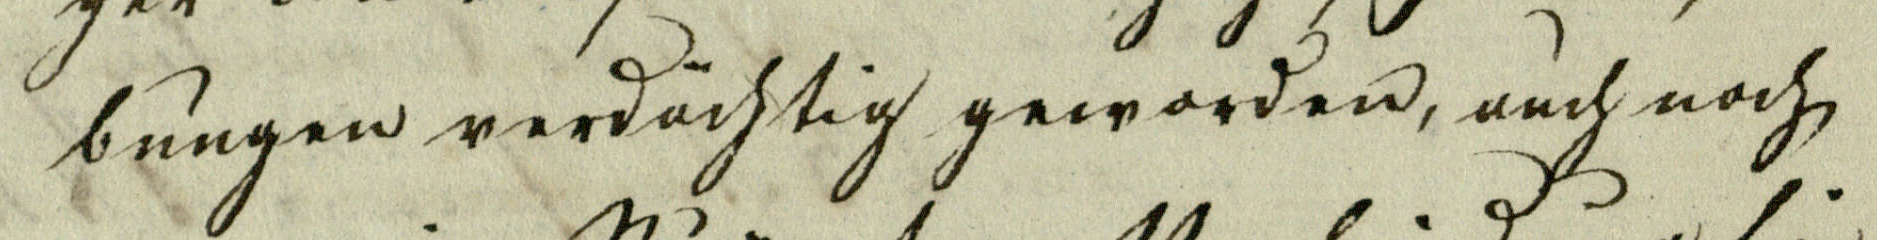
bungen verdächtig geworden, auch noch
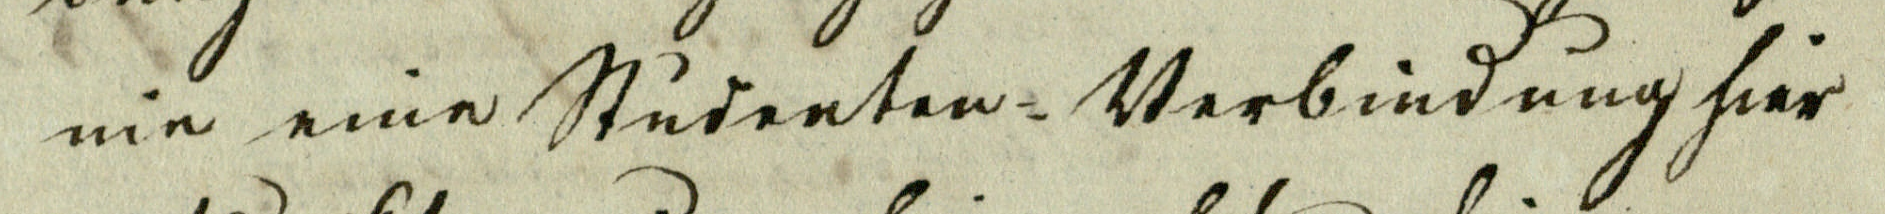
nie eine Studenten-Verbindung hier
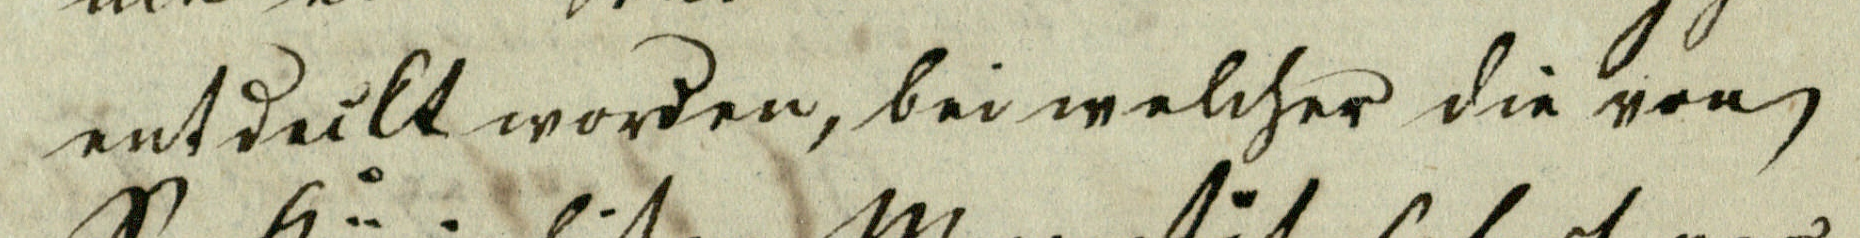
entdeckt worden, bei welcher die von
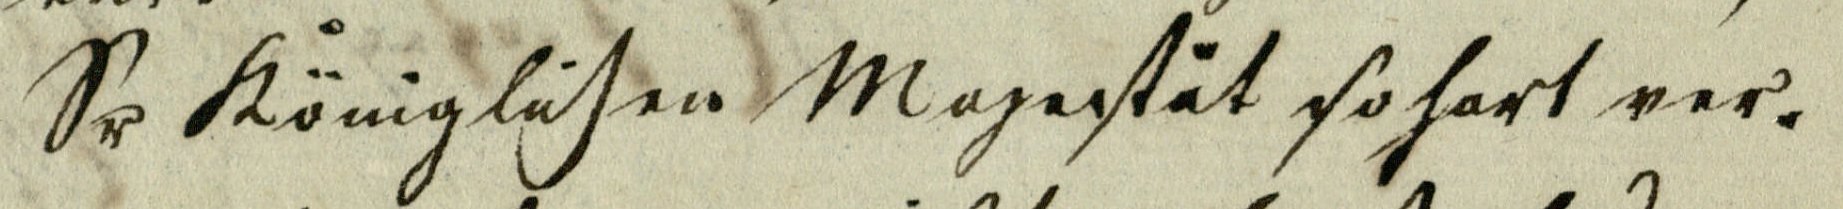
Sr Königlichen Majestät so hart ver¬
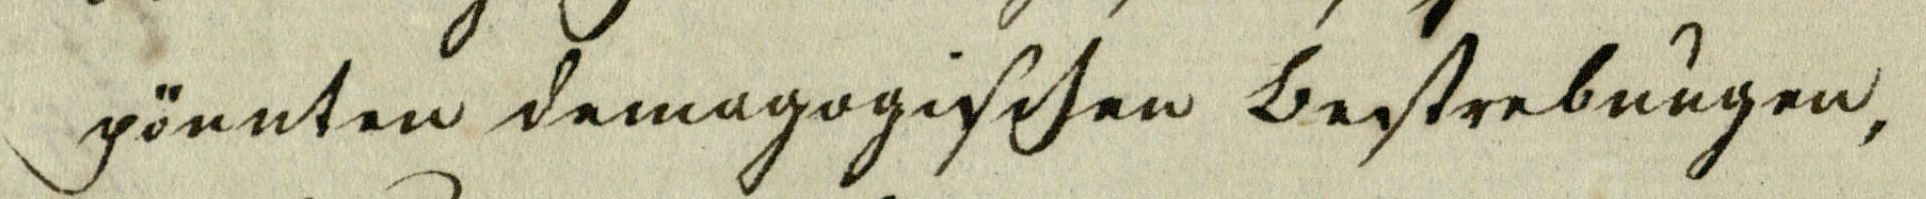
pönnten demagogischen Bestrebungen
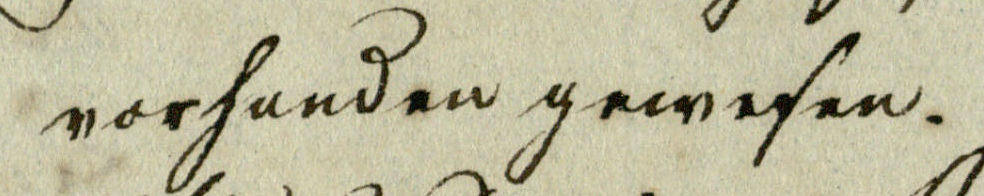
vorhanden gewesen.
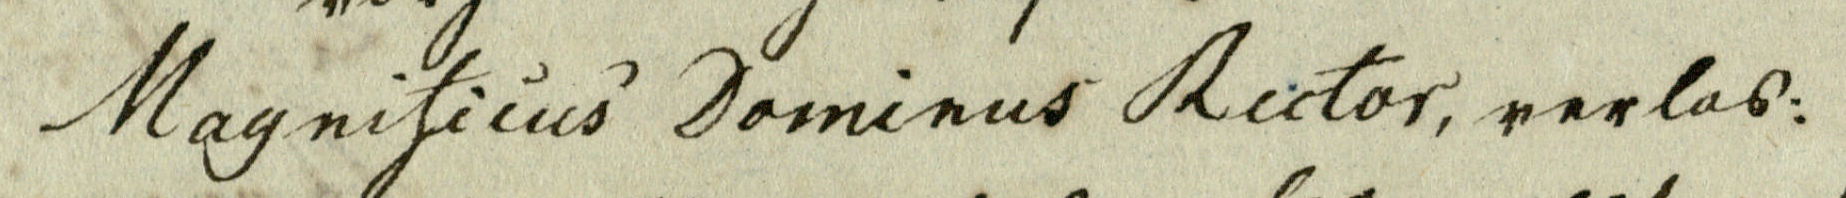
Magnificus Dominus Rector, verlas:
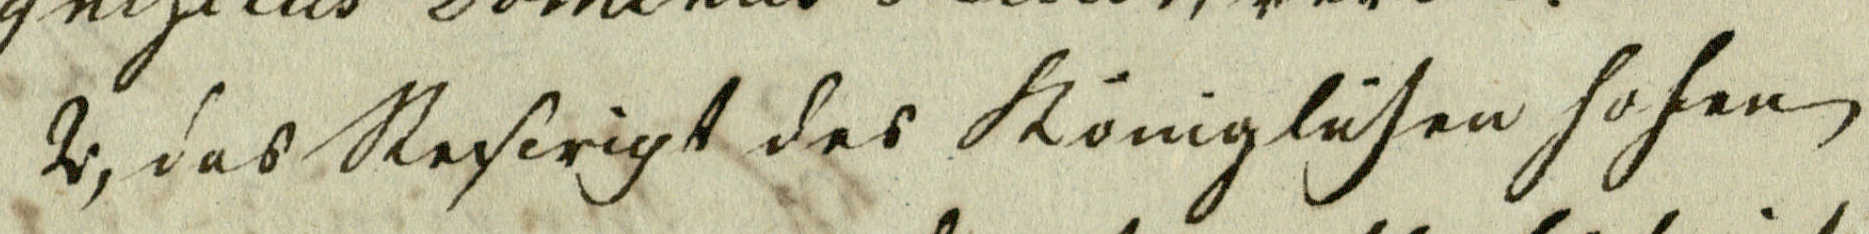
2, das Rescript des Königlichen hohen
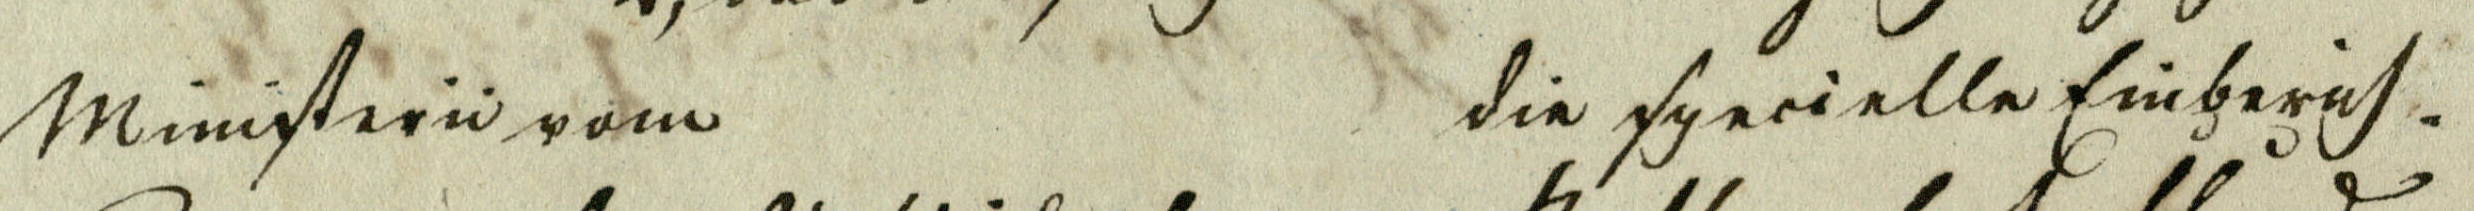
Ministerii vom die specielle Einberich¬
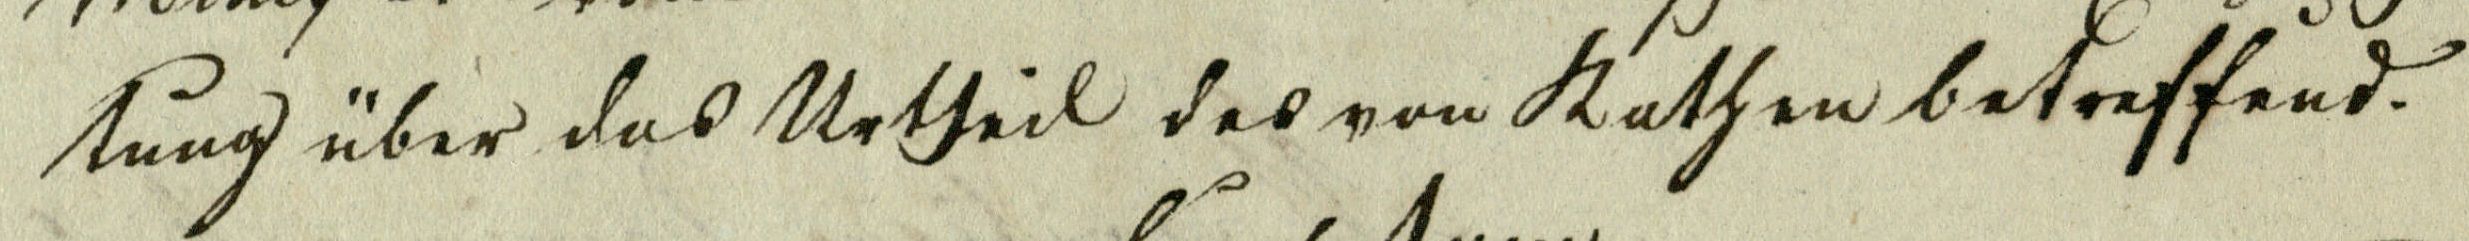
tung über das Urtheil des von Kathen betreffend.
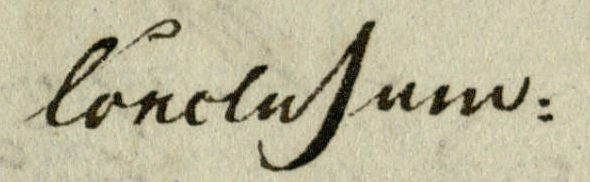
Conclusum:
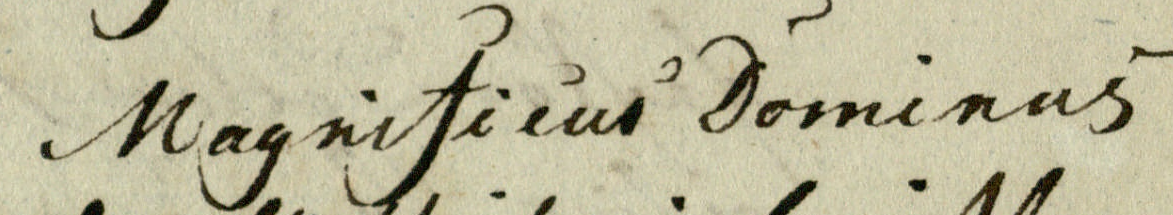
Magnificus Dominus
